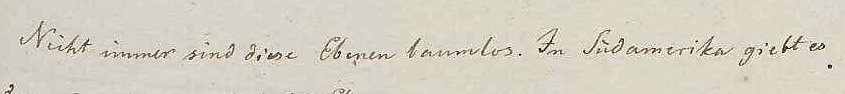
Nicht immer sind diese Ebenen baumlos. In Südamerika giebt es
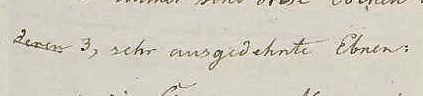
deren 3, sehr ausgedehnte Ebnen:
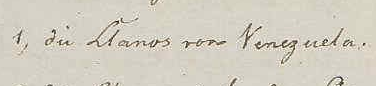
1, die Llanos von Venezuela.
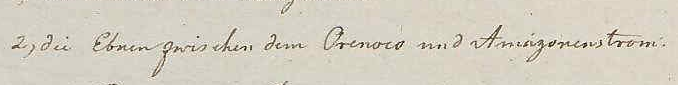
2, die Ebnen zwischen dem Orenoco und Amazonenstrom.
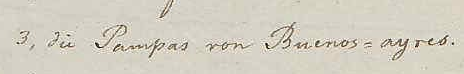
3, die Pampas von Buenos-ayres.
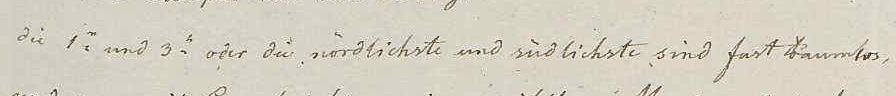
die 1￼ und 3￼ oder die nördlichste und südlichste sind fast baumlos,
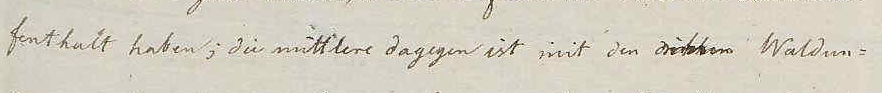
fenthalt haben; die mittlere dagegen ist mit den dichten Waldun-
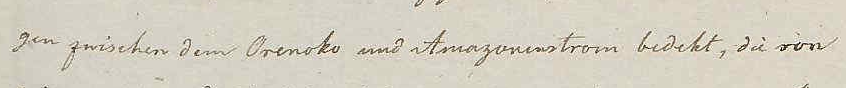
gen zwischen dem Orenoko und Amazonenstrom bedekt, die von
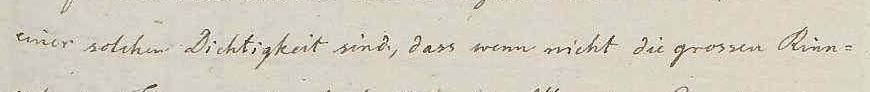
einer solchen Dichtigkeit sind, dass wenn nicht die grossen Rinn-
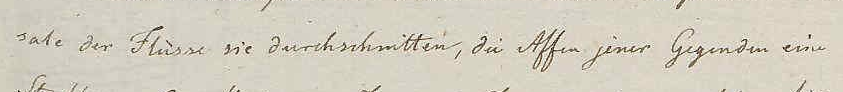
sale der Flüsse sie durchschnitten, die Affen jener Gegenden eine
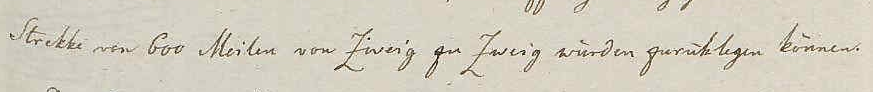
Strekke von 600 Meilen von Zweig zu Zweig würden zurüklegen können.
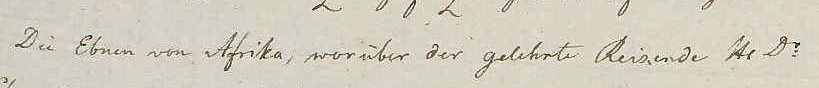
Die Ebnen von Afrika, worüber der gelehrte Reisende H￼ Dr
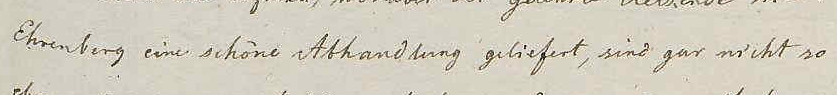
Ehrenberg eine schöne Abhandlung geliefert, sind gar nicht so
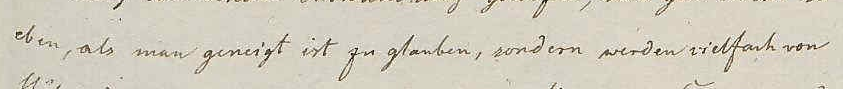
eben, als man geneigt ist zu glauben, sondern werden vielfach von
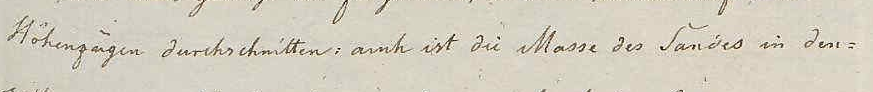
Höhenzügen durchschnitten: auch ist die Masse des Sandes in den-
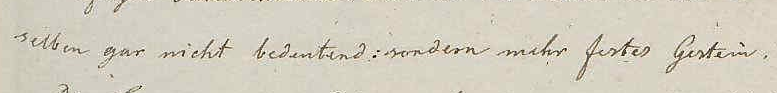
selben gar nicht bedeutend: sondern mehr festes Gestein.
